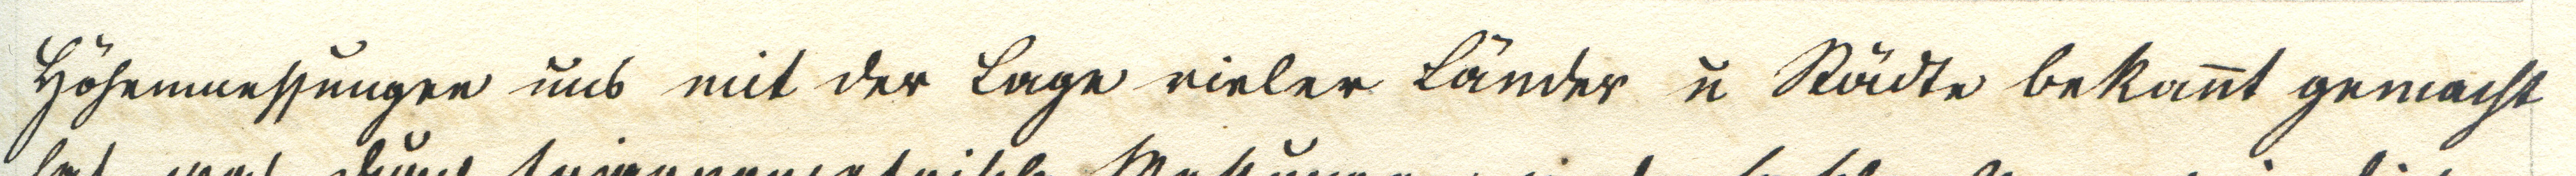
Höhenmessungen uns mit der Lage vieler Länder u Städte bekañt gemacht
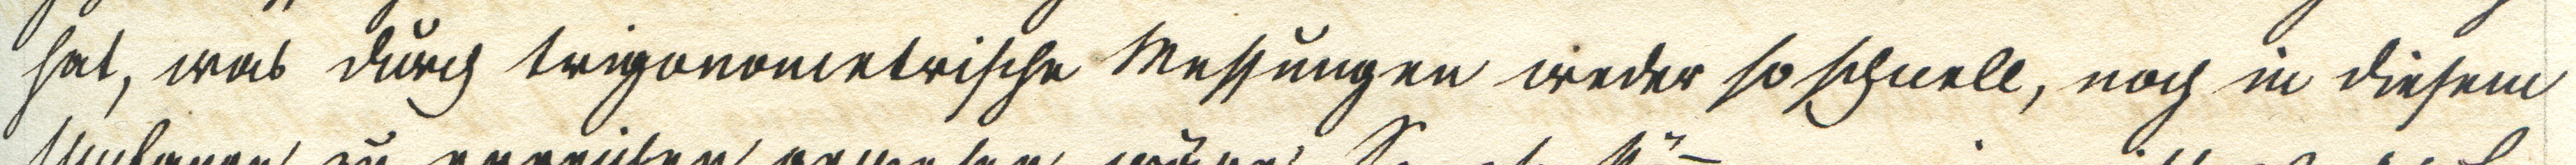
hat, was durch trigonometrische Messungen weder so schnell, noch in diesem
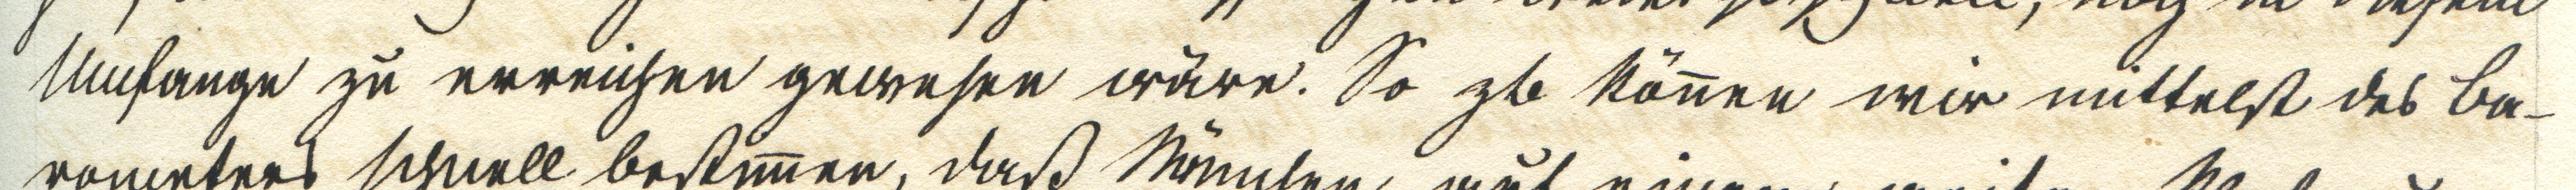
Umfange zu erreichen gewesen wäre. So zB köñen wir mittelst des Ba-
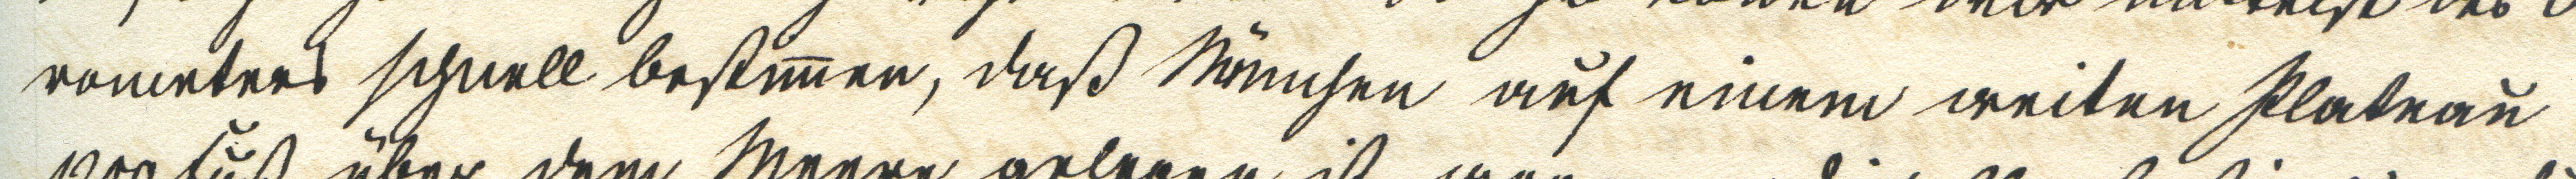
rometers schnell bestim̃en, daß München auf einem weiten Plateau
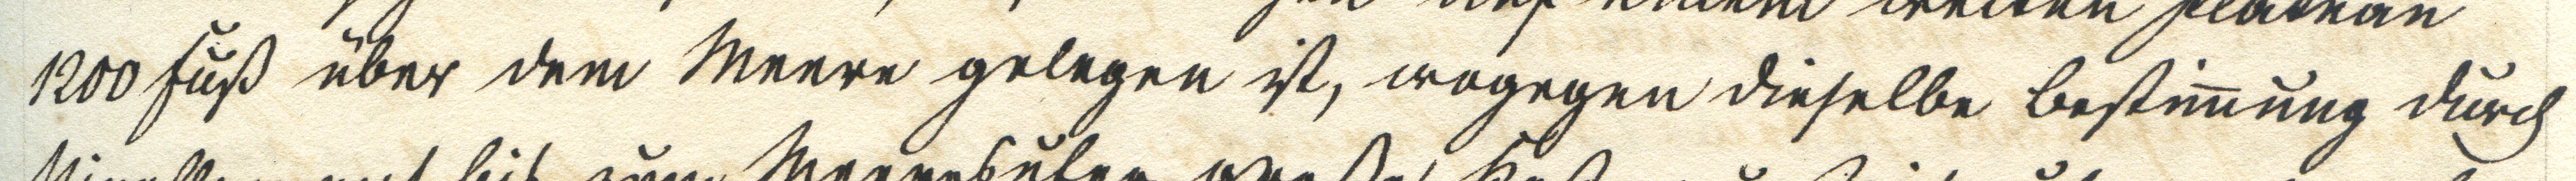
1200 Fuß über dem Meere gelegen ist, wogegen dieselbe Bestim̃ung durch
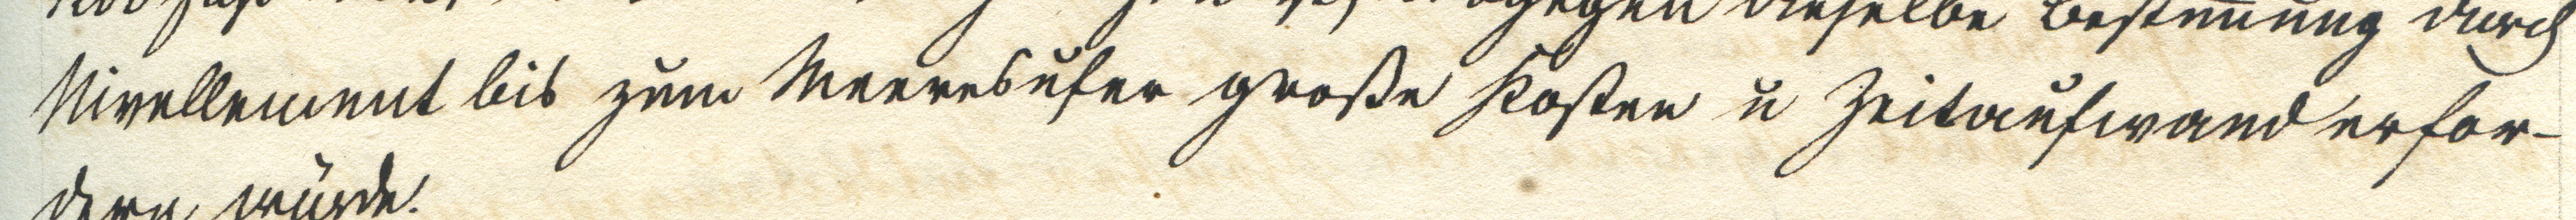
Nivellement bis zum Meeresufer große Kosten u Zeitaufwand erfor-
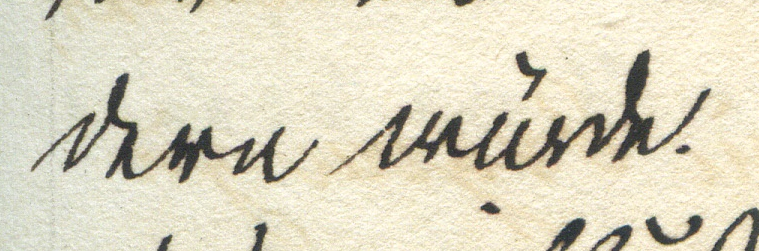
dern würde.
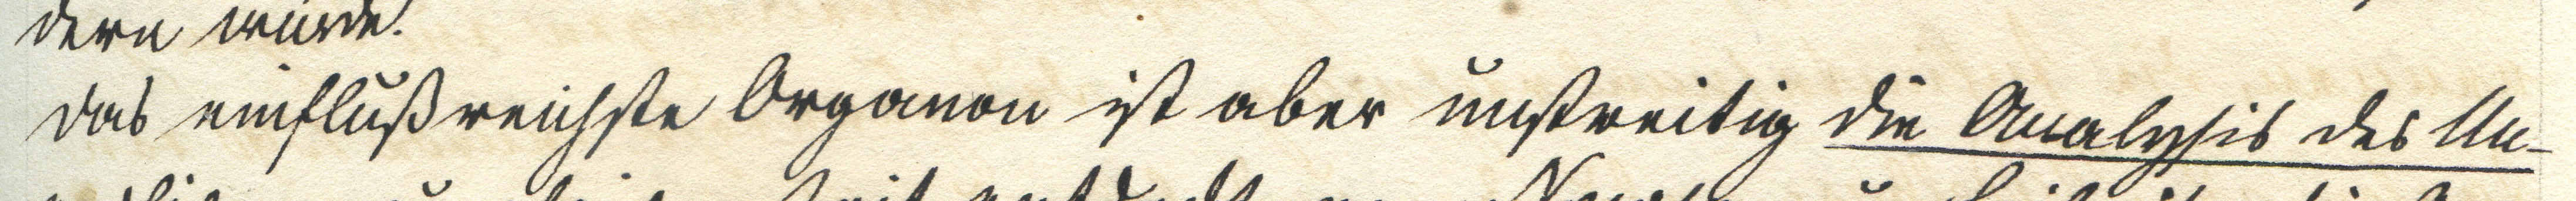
Das einflußreichste Organon ist aber unstreitig die Analysis des Un-
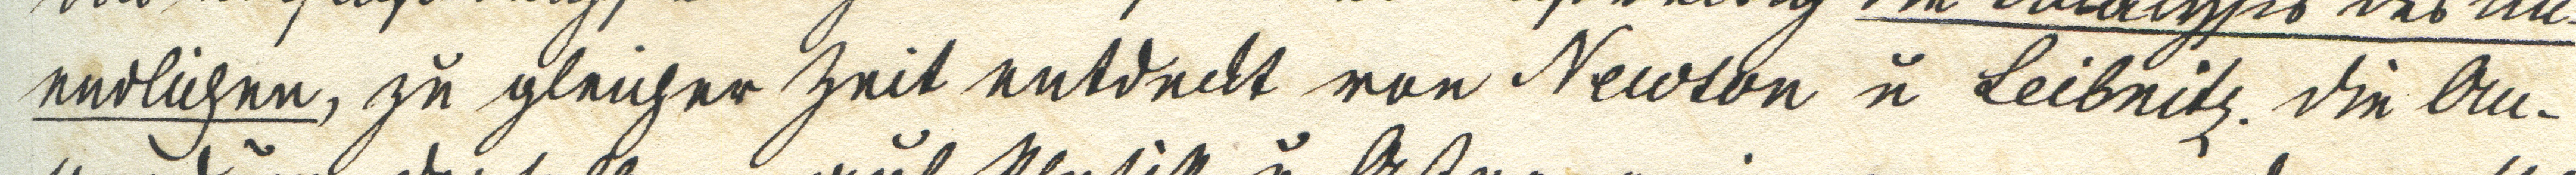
endlichen, zu gleicher Zeit entdeckt von Newton u Leibnitz. Die An-
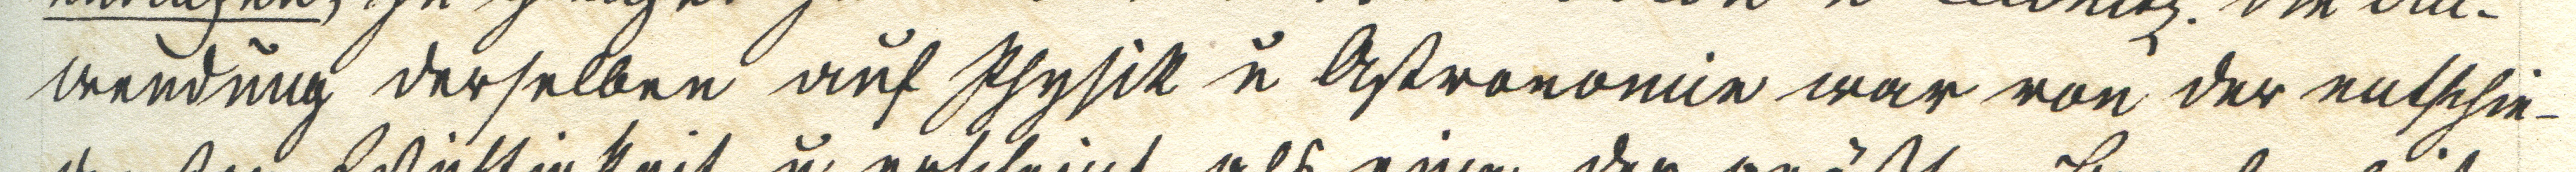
wendung derselben auf Physik u Astronomie war von der entschie-
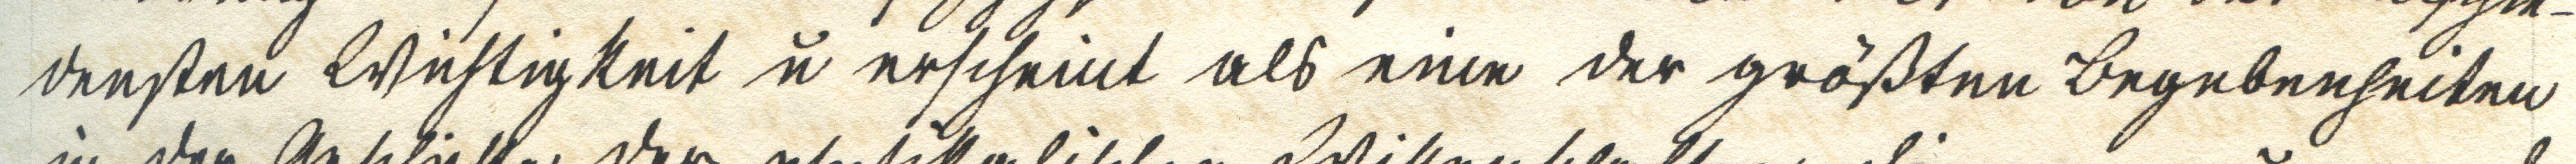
densten Wichtigkeit u erscheint als eine der größten Begebenheiten
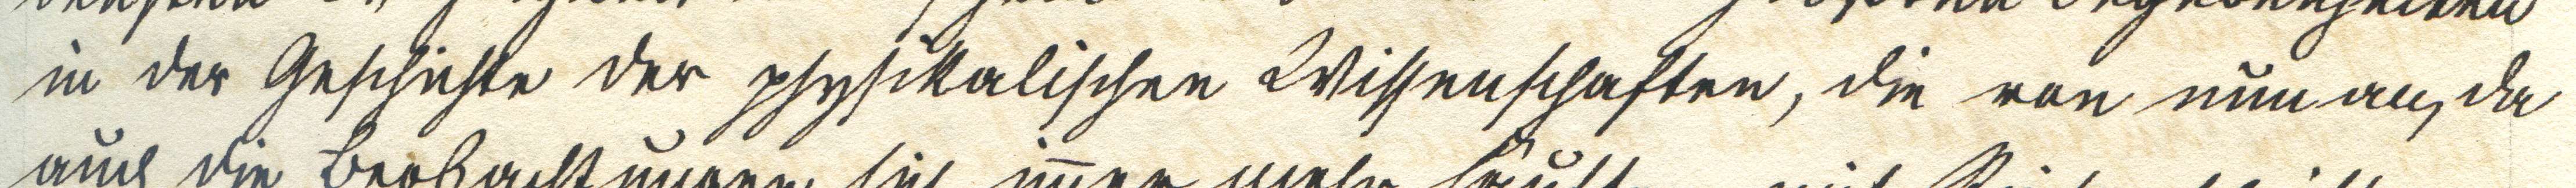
in der Geschichte der physikalischen Wissenschaften, die von nun an, da
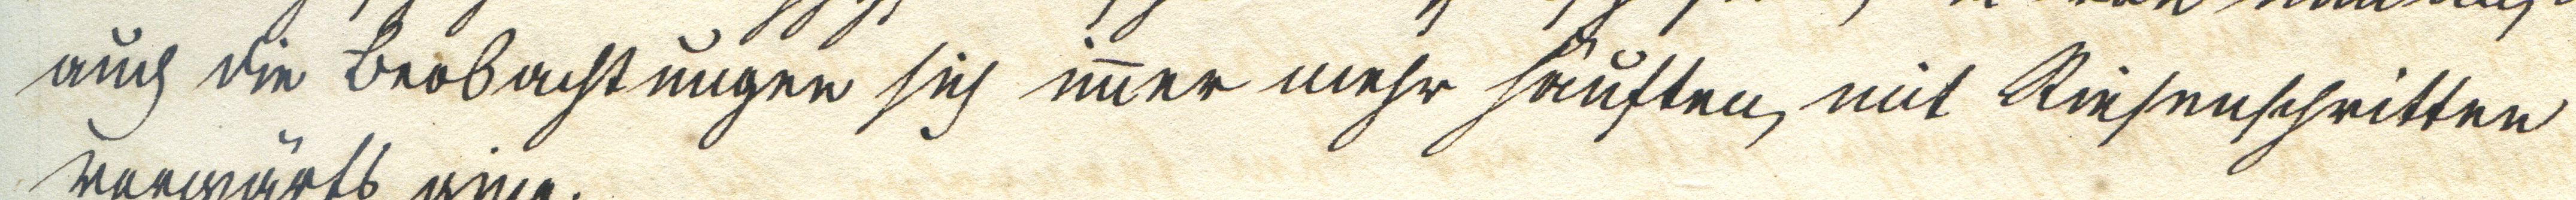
auch die Beobachtungen sich im̃er mehr häuften, mit Riesenschritten
